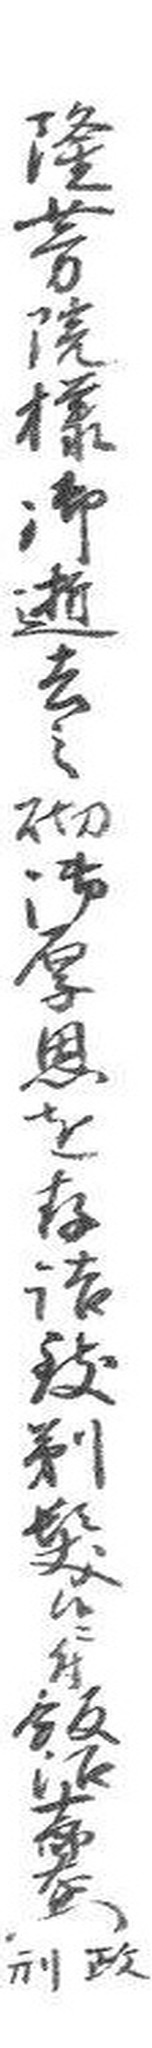隆芳院様御逝去之砌御厚恩を存詰致剃髪候ニ付飯沼十郎右衛門政刑
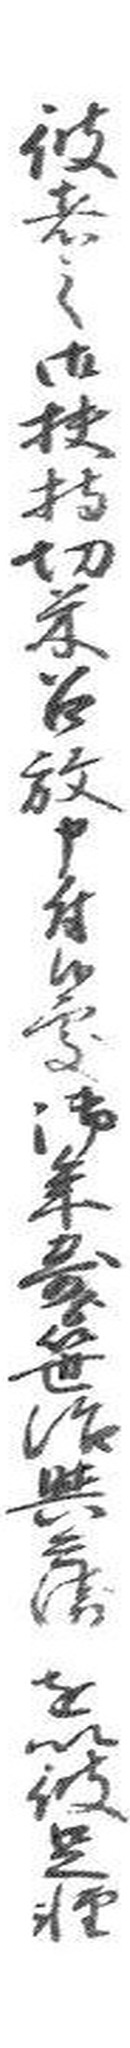彼者之御扶持切米召放申付候処御年寄ゟ笹治与兵衛を以彼足軽
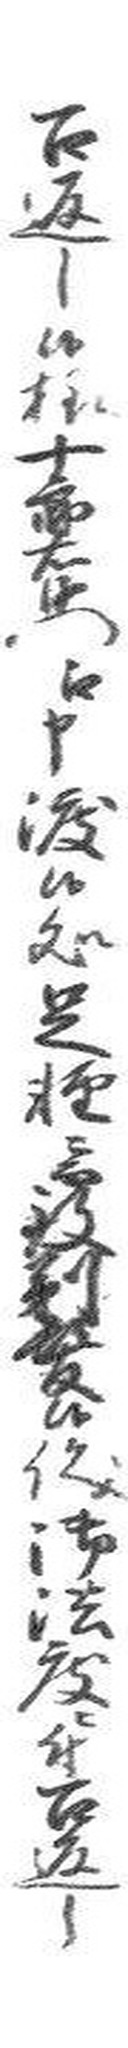召返し候様十郎右衛門江申渡候処足軽ニ而致剃髪候儀御法度ニ付召返し
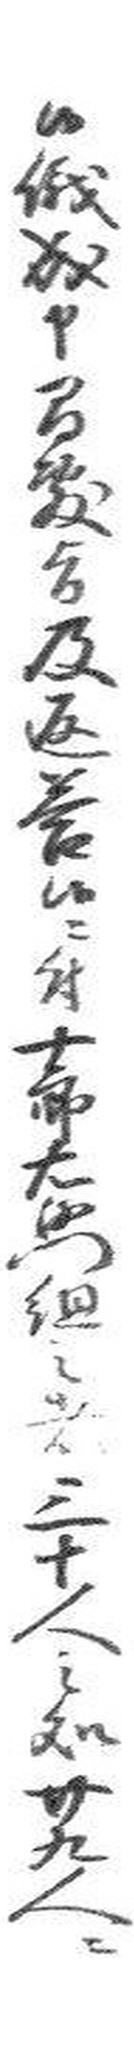候儀成申間敷旨及返答候ニ付十郎右衛門組之者三十人之処廿九人ニ
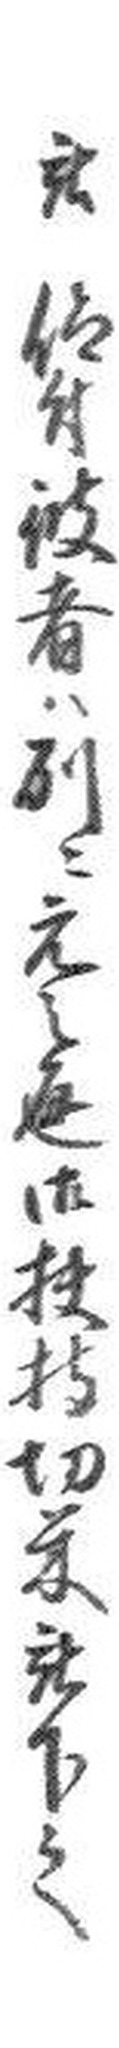被仰付彼者ハ別ニ元之通御扶持切米被下之
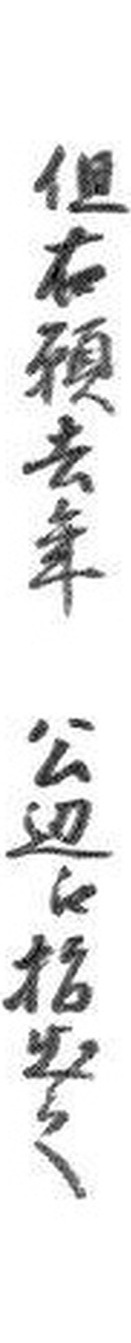但右願去年公辺江指出之
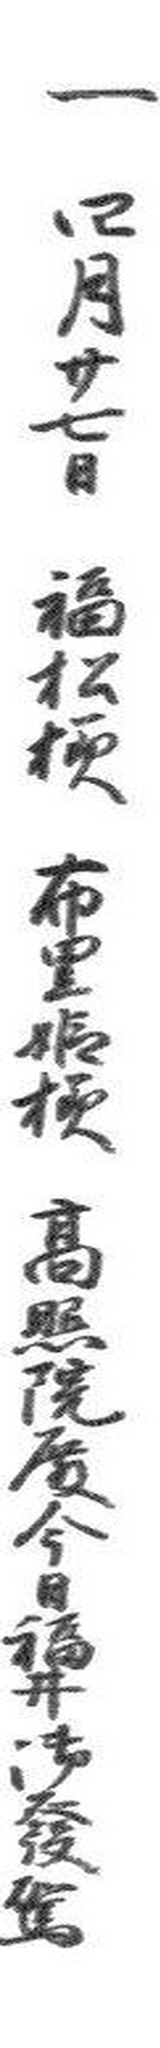一四月廿七日福松様布里姫様高照院殿今日福井御発駕
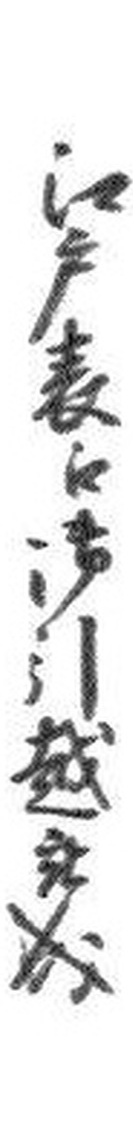江戸表江御引越被成
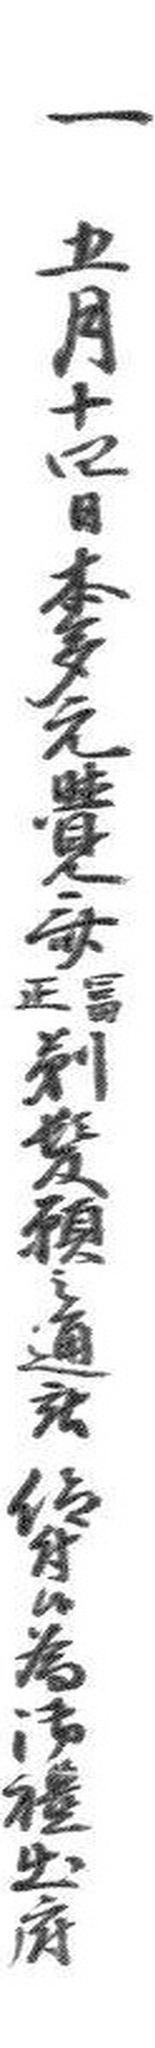一五月十四日本多元覚斎富政剃髪願之通被仰付候為御礼出府
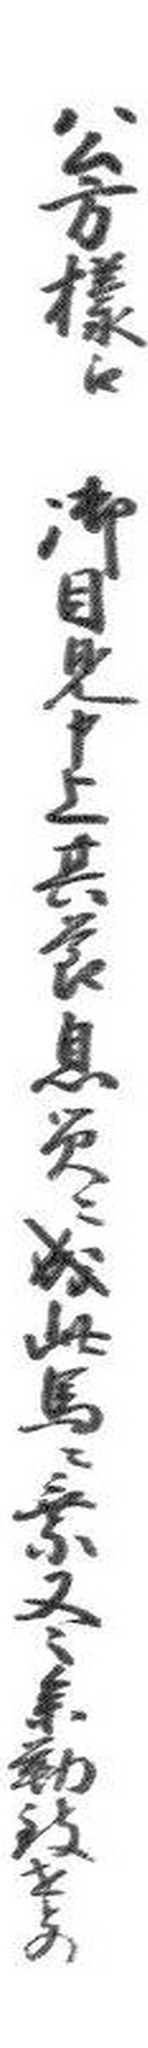公方様江御目見申上其節息災ニ成此馬ニ乗又々参勤致せとの
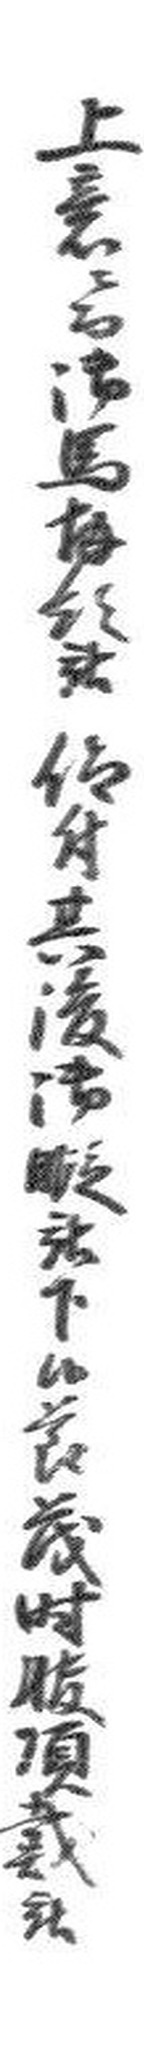上意ニ而御馬拝領被仰付其後御暇被下候節茂時服頂戴被

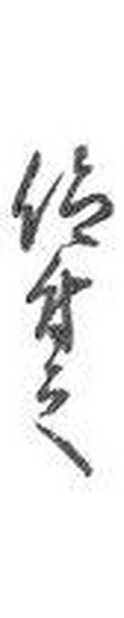仰付之
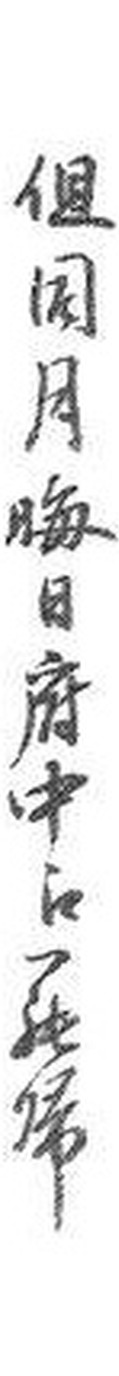但同月晦日府中江罷帰
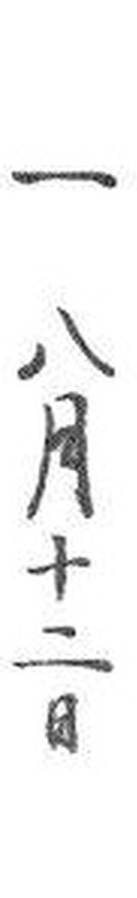一八月十二日
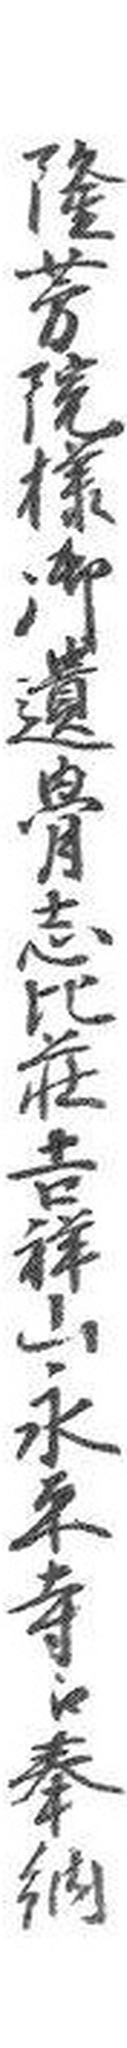隆芳院様御遺骨志比荘吉祥山永平寺江奉納
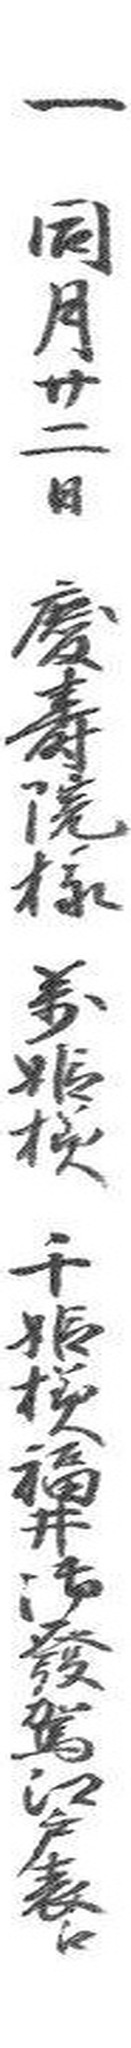一同月廿二日慶寿院様万姫様千姫様福井御発駕江戸表江
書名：家譜 五 光通公 従寛永十三年到万治二年
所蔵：福井県文書館 Fukui Prefectural Archives
